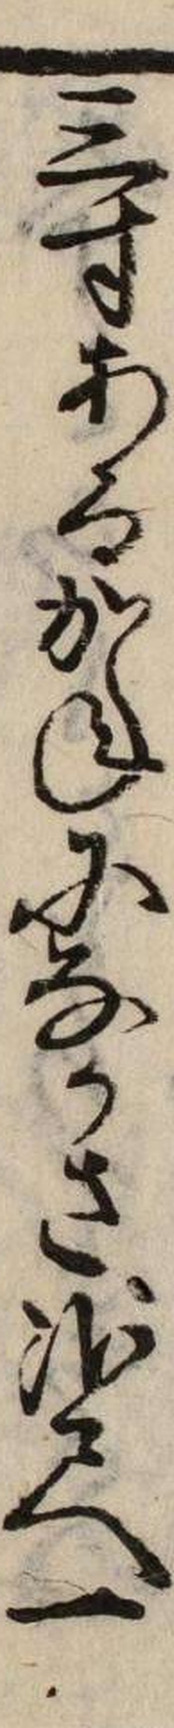三寸あるかねになかさ弐尺一
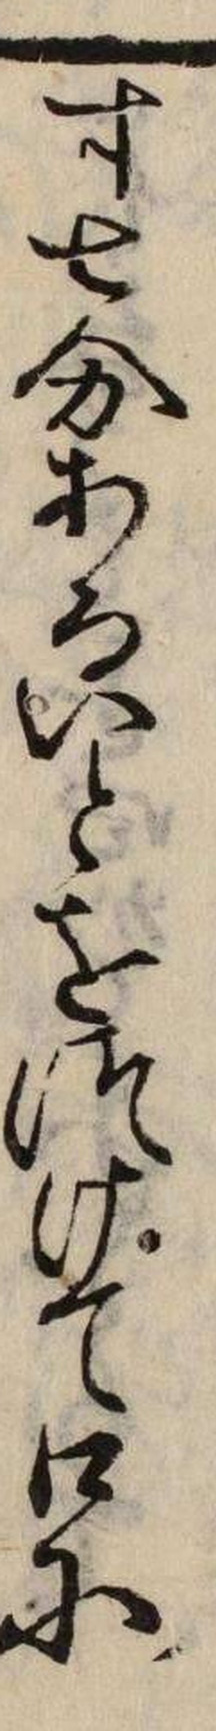寸七分あるいとをつけて口に
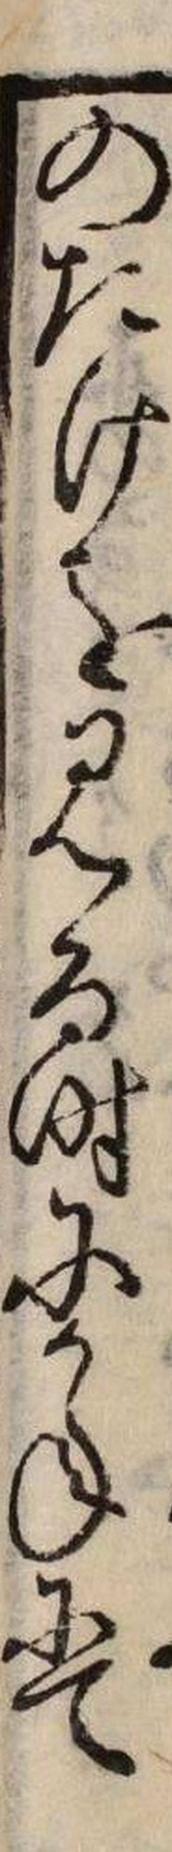のたけを見る時にかねにて
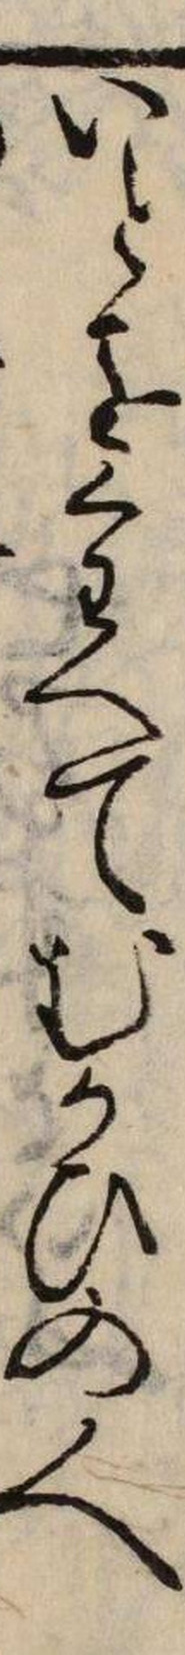いとをくわへてむかひの人
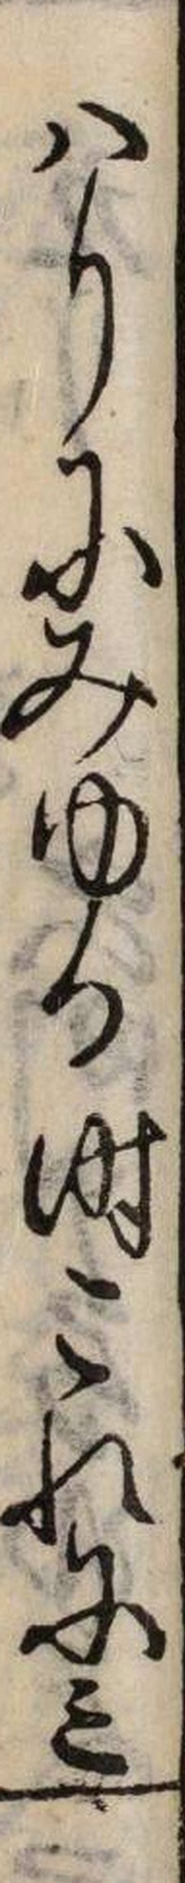八りにみゆる時これにみ
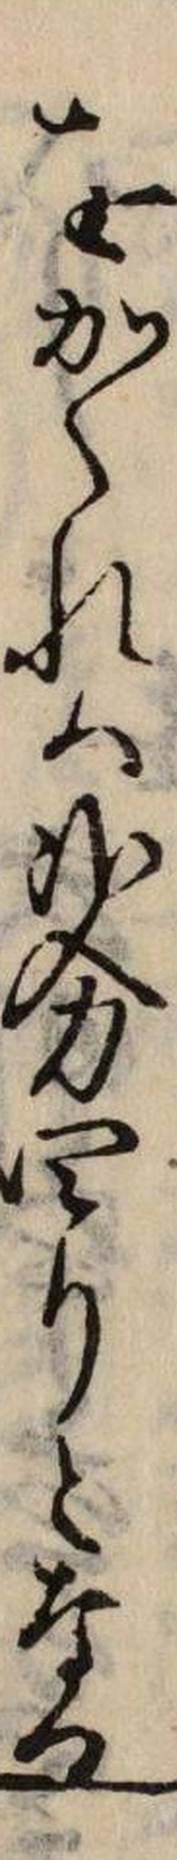をかくれは弐分四りとなる
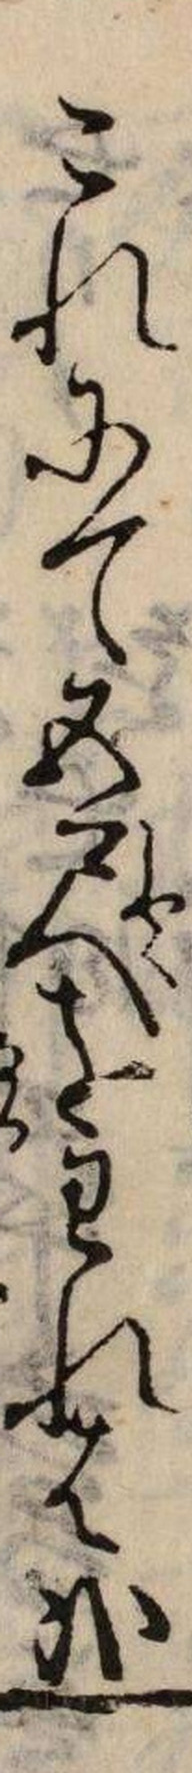これにて五尺をわれは弐
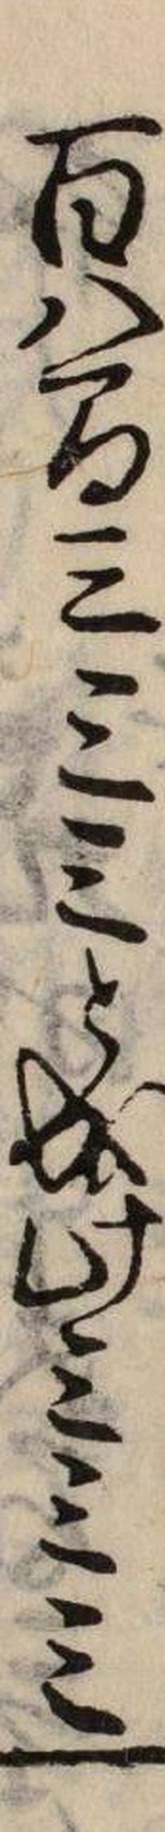百八百三三三と成此三三三
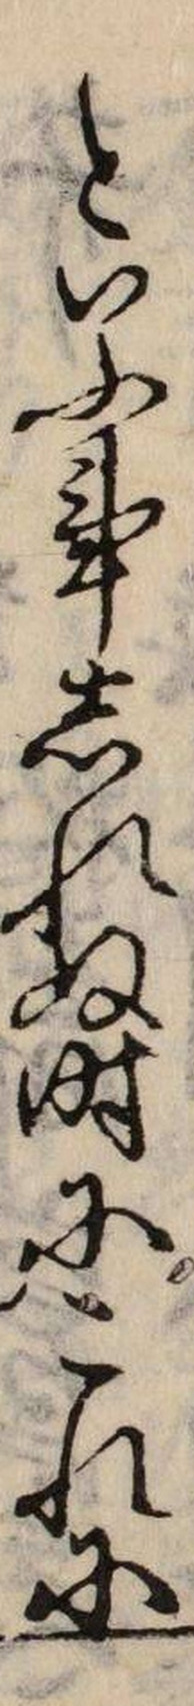といふ事しれぬ時にこれに
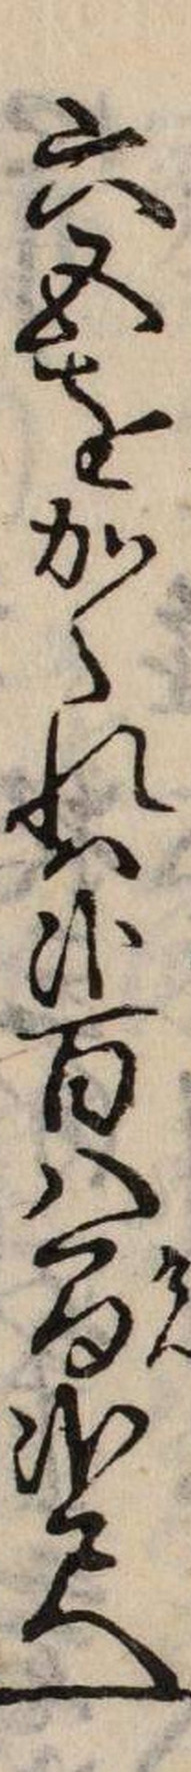六五をかくれは弐百八間弐尺
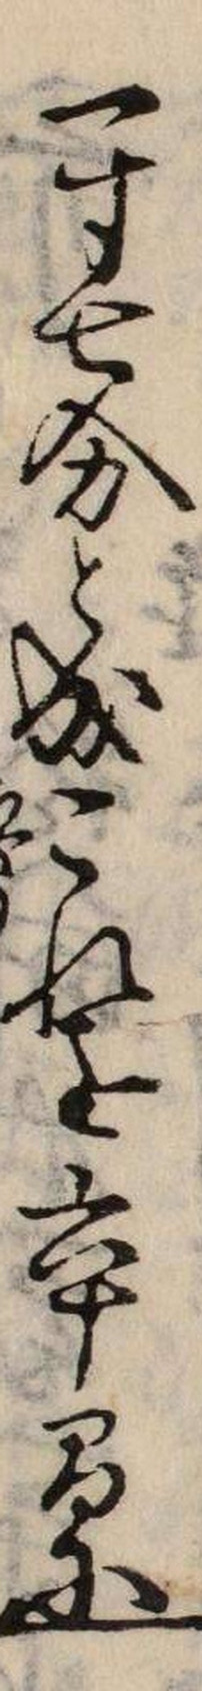一寸七分と成これを六十間に
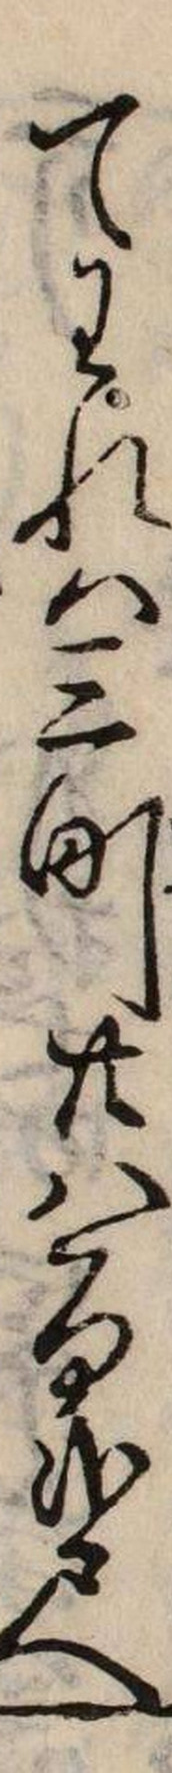てわれは三町廿八百弐尺
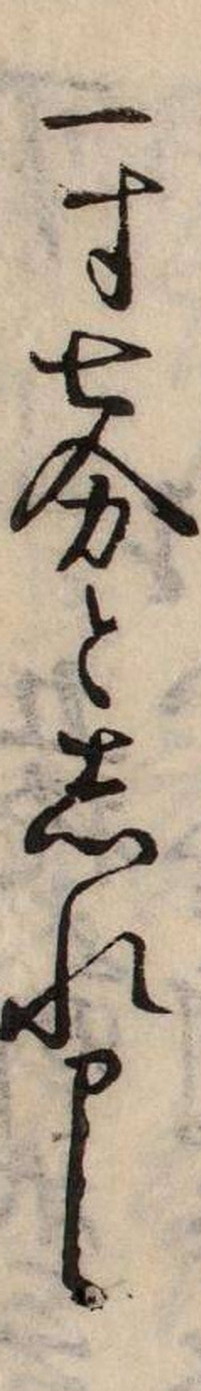一寸七分としれ申候

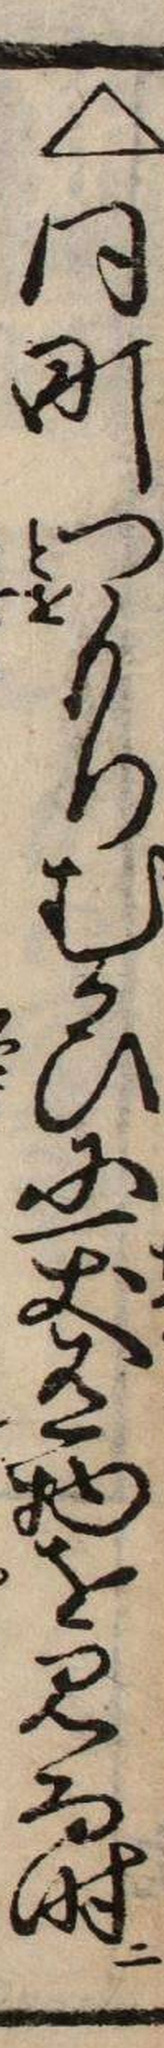△同町つもりむかひに一丈有物を見る時に
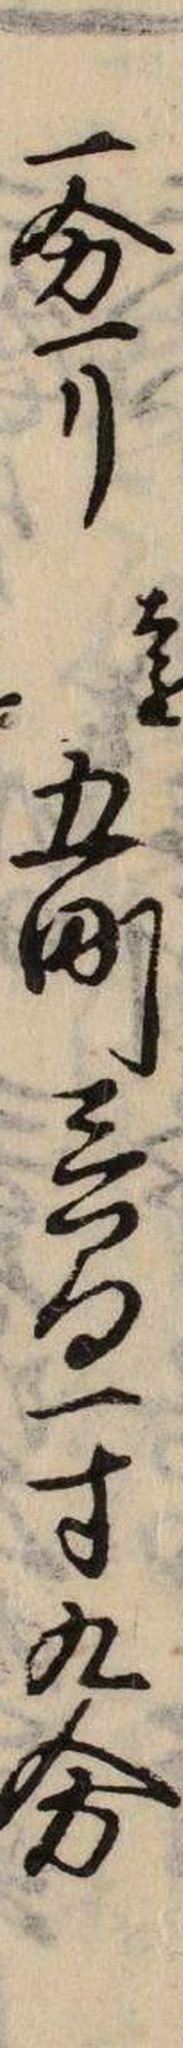一分一り遠五町三間一寸九分
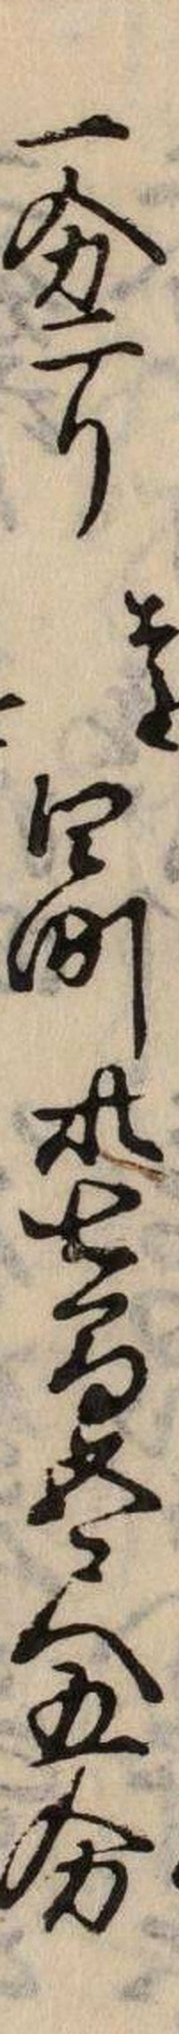一分二り遠四町卅七間五尺五分
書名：塵劫記（寛永11年自跋、京都府立京都学・歴彩館追貴8）
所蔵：京都府立京都学・歴彩館 国文学研究資料館
